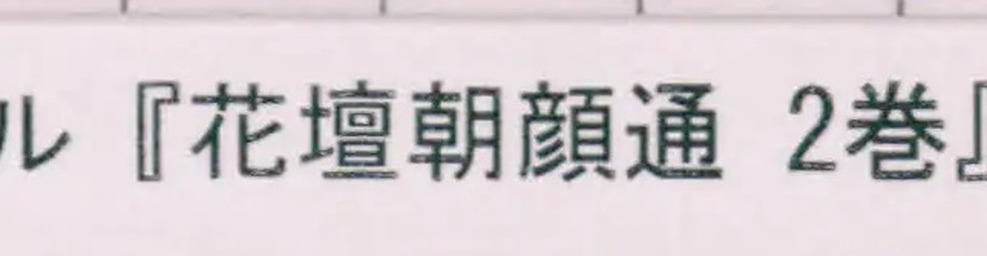花壇朝顔通乾

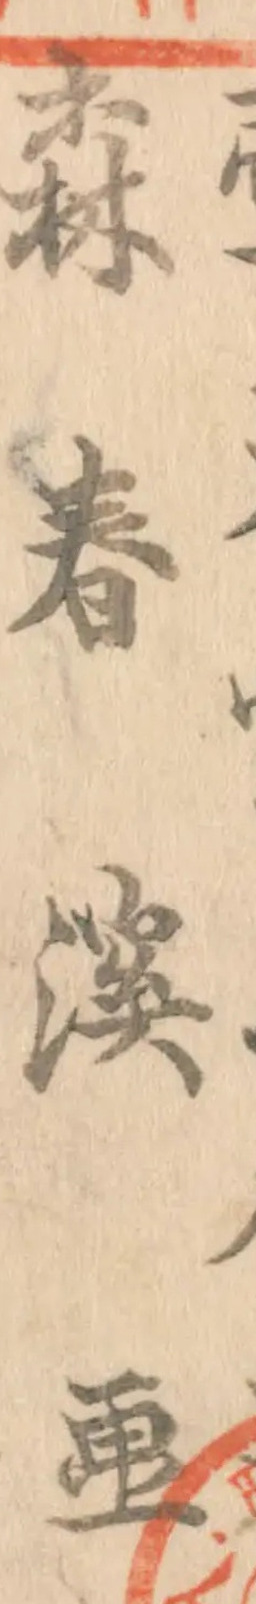森春渓画
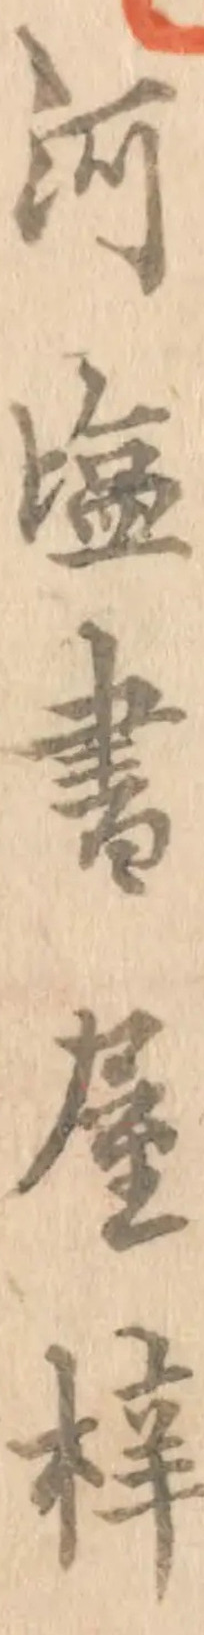河塩書屋梓
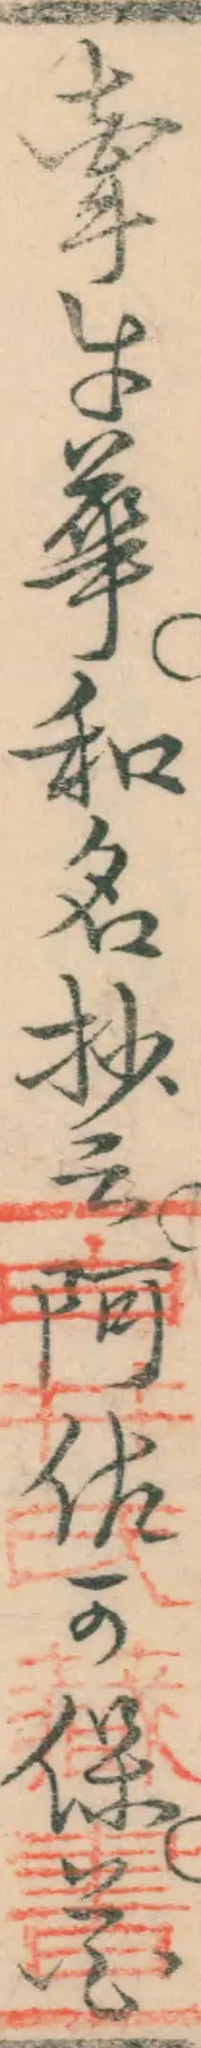牽牛華。和名抄云。阿佐可保。花
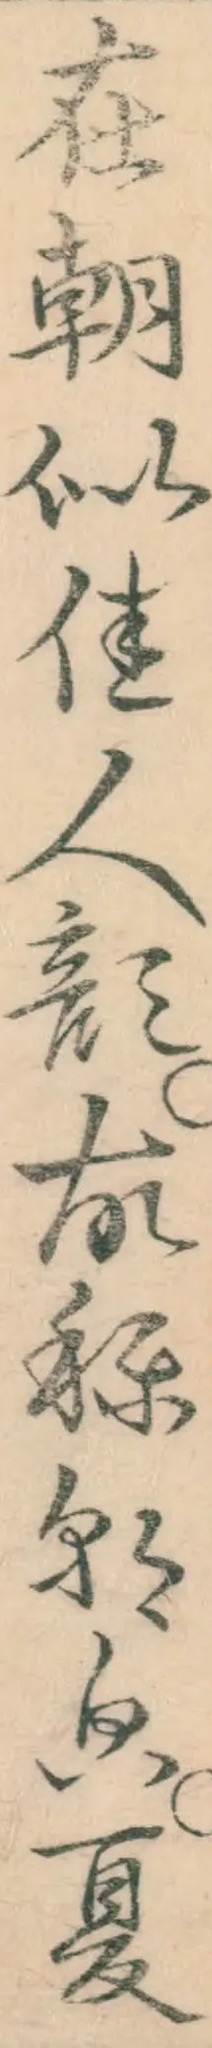在朝似佳人顔。故称朝貌。夏
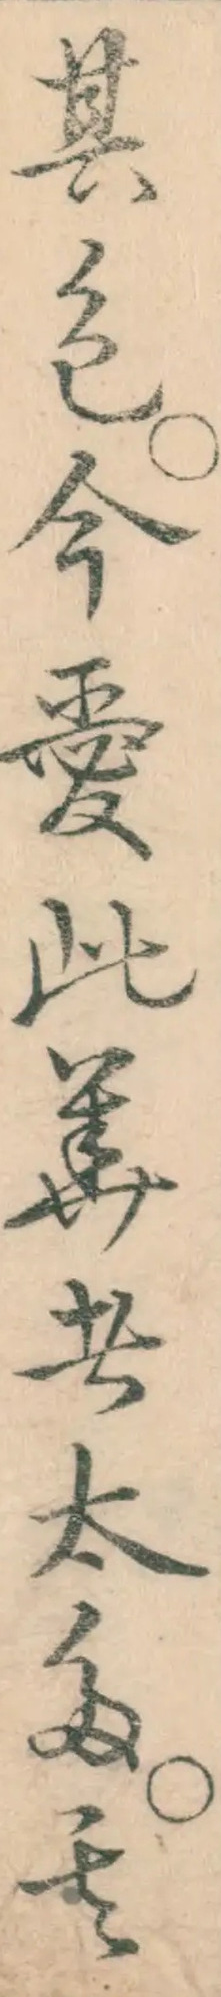其色。今愛此美者太多。其
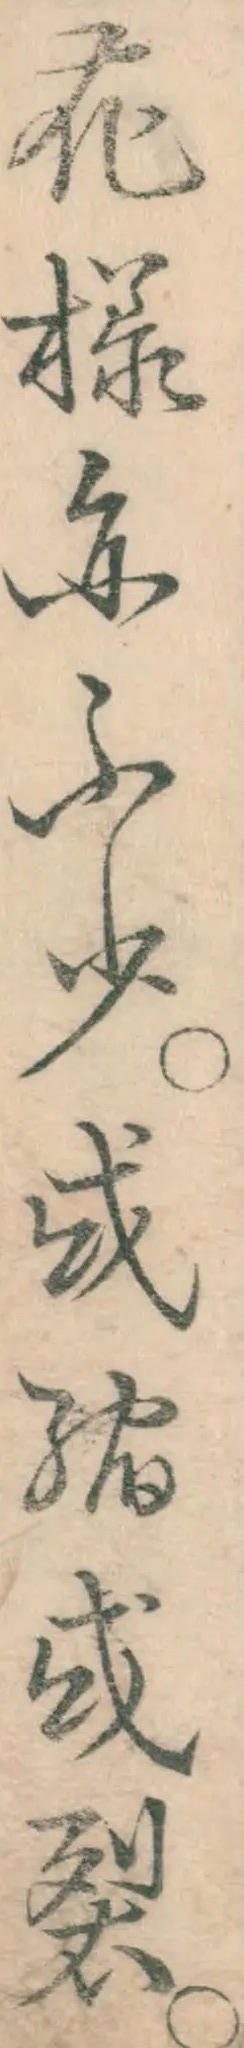花様亦不少。或縮或裂。

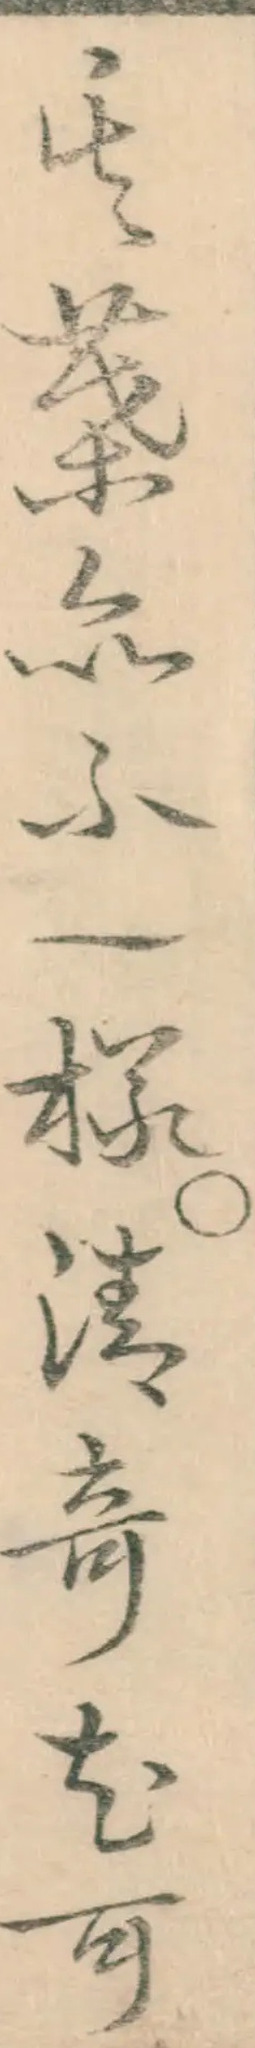其葉又不一様。清奇尤可
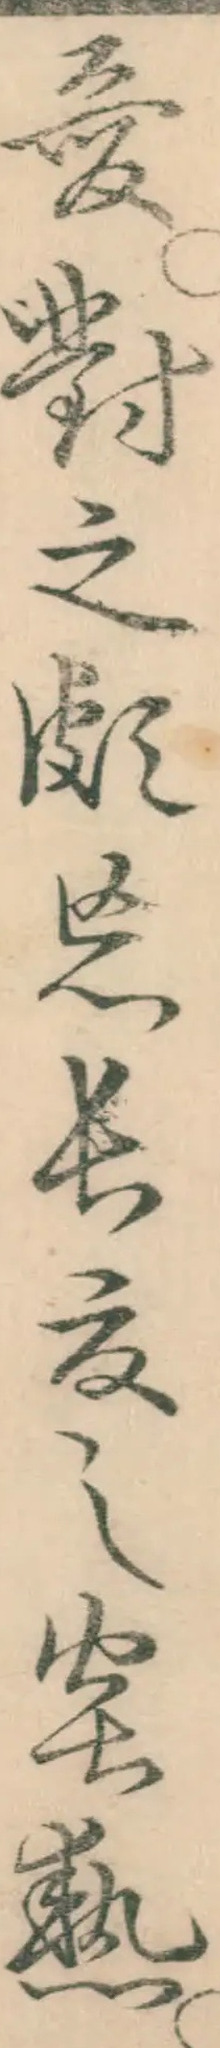愛。対之頗忘長夏之炎熱。
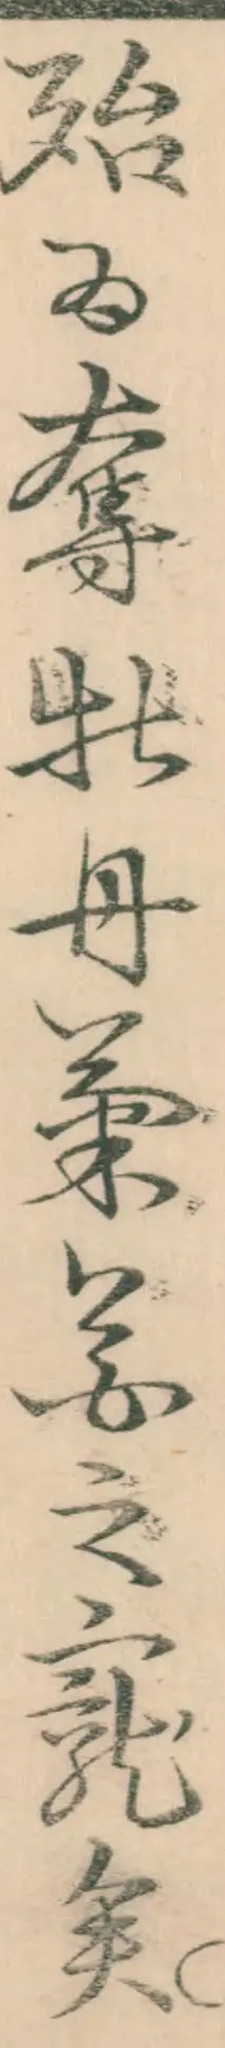殆為奪牡丹菊花之寵矣。
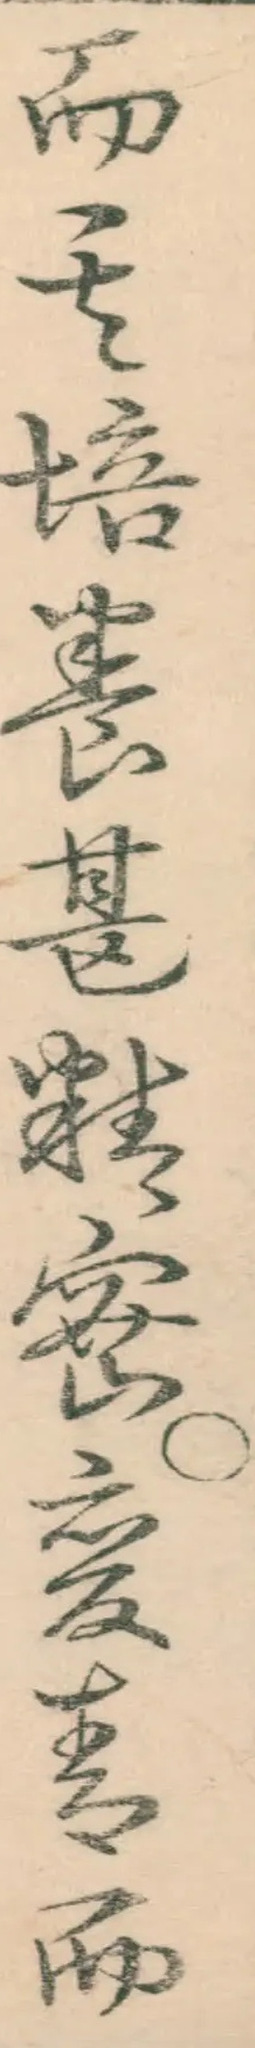而其培養甚精密。変青而
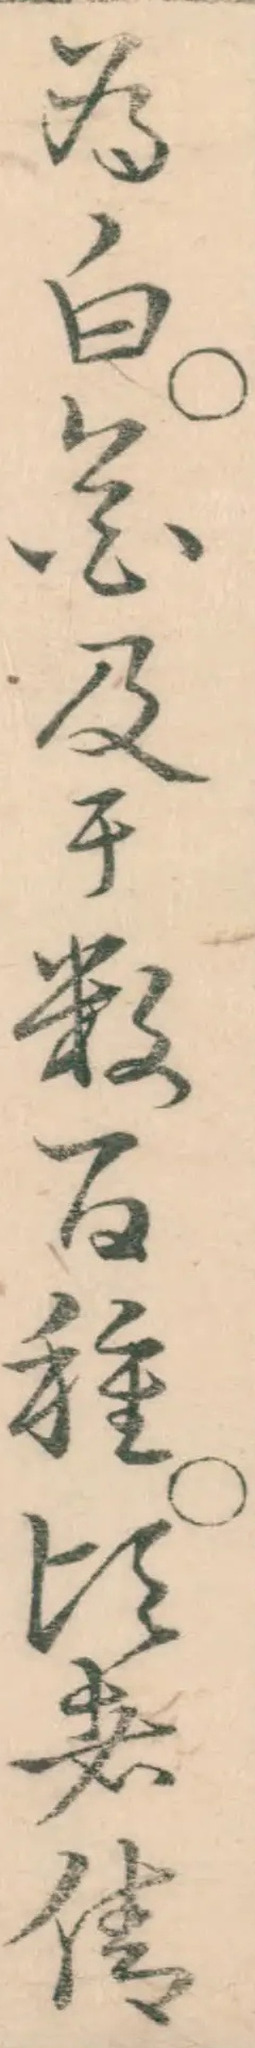為白。花及于数百種。頃者倩
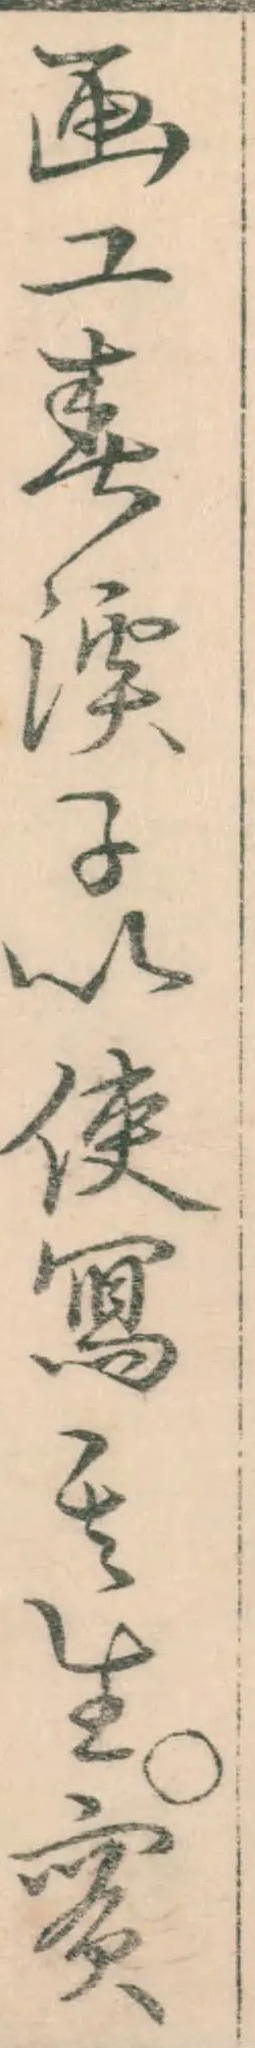画工春渓子以使写其生。実
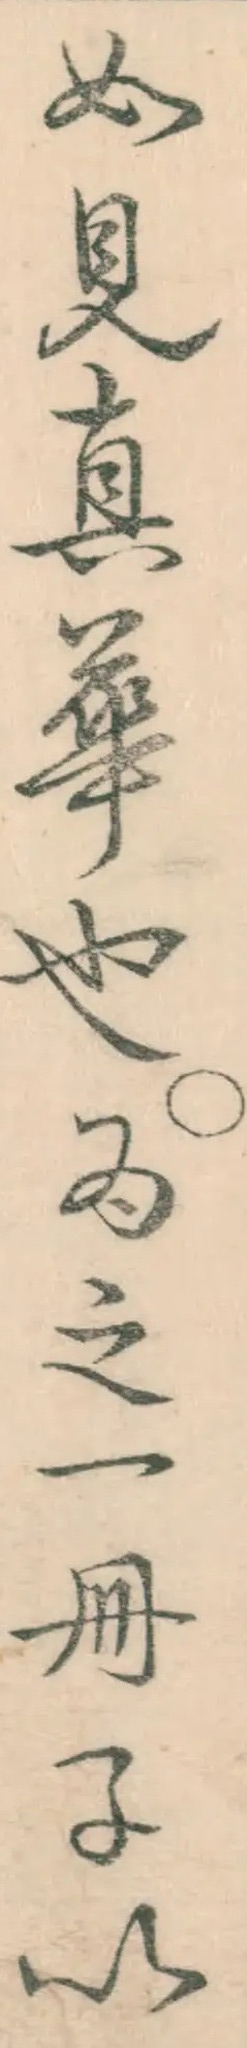如見真華也。為之一冊子以
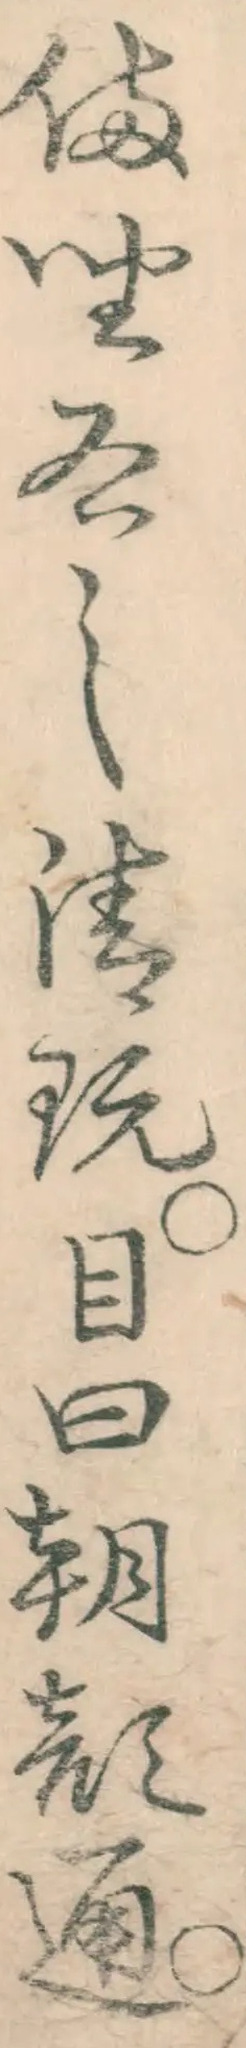備坐右之清玩。目曰朝顔通。

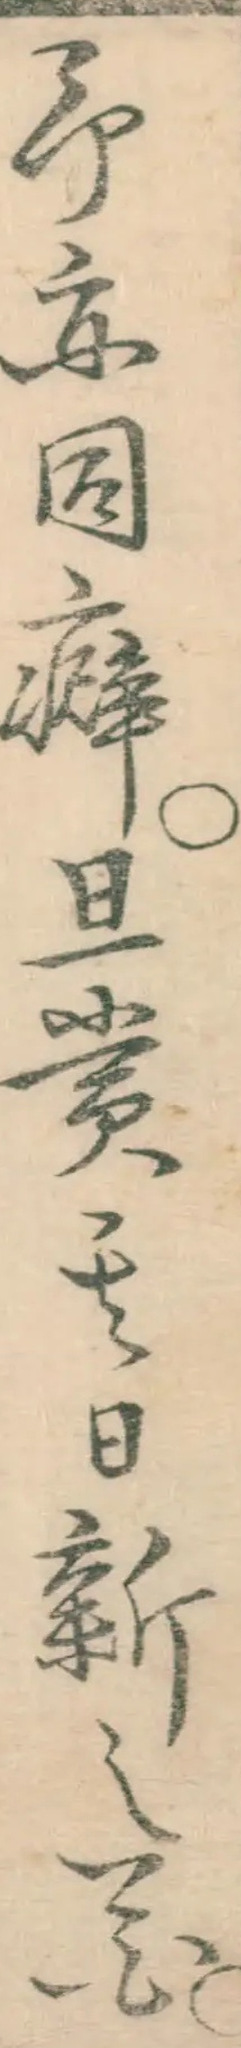予亦因癖。旦賞其日新之花。
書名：花壇朝顔通 2巻. [1]
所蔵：国立国会図書館 National Diet Library, JAPAN
